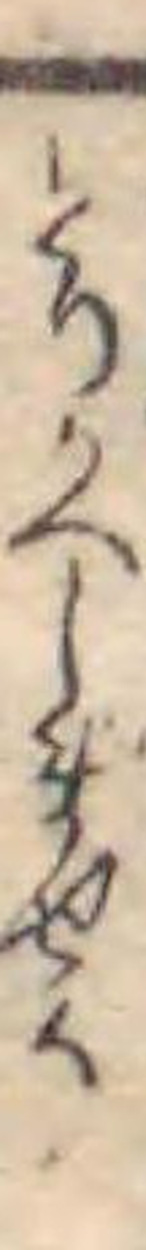とりかへしませう
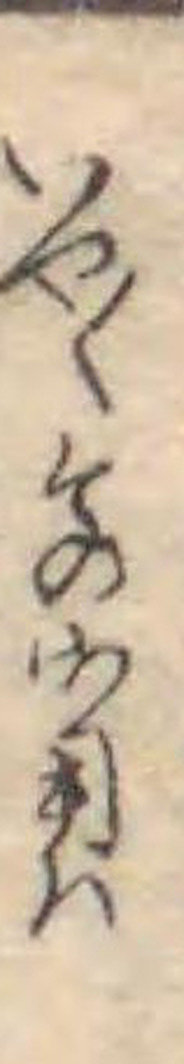いや〳〵その御用は
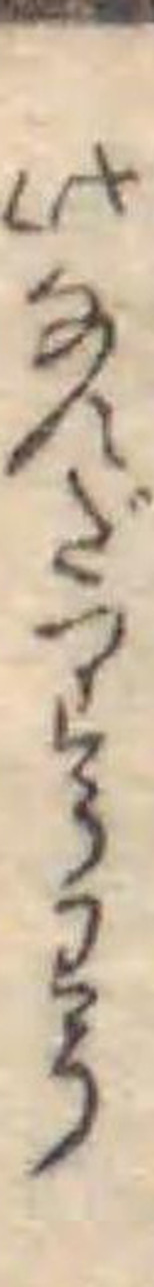此なんだりうわう
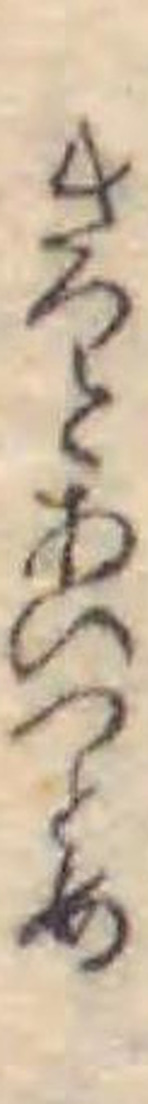きつとあいつとめ
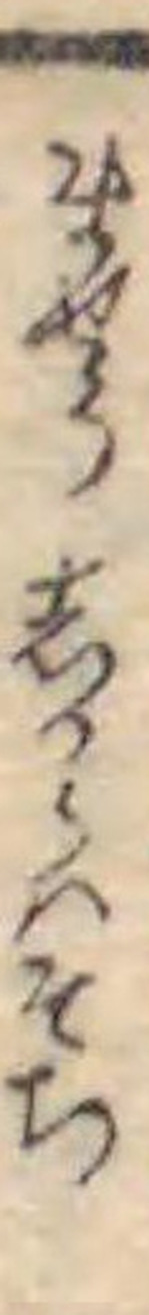ませうしからはそち
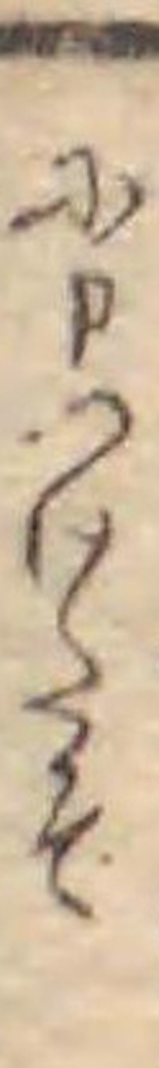に申つけたぞ

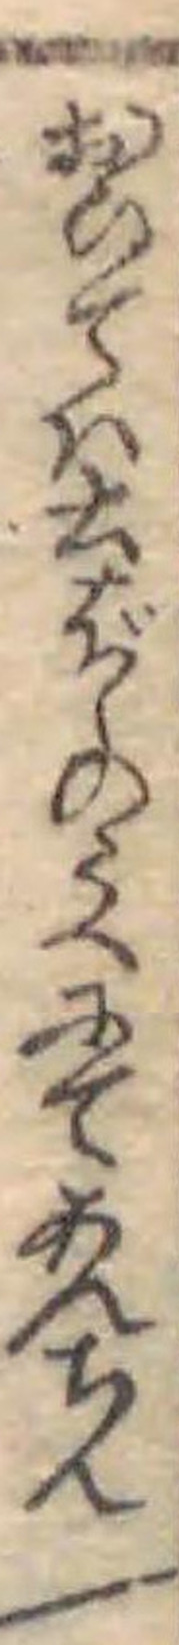おひては土ばしのうへにてあんちん
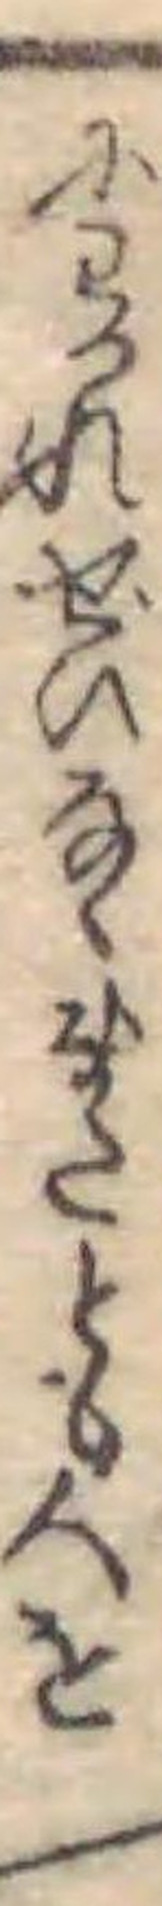にわかれぜひなくまたとも人を
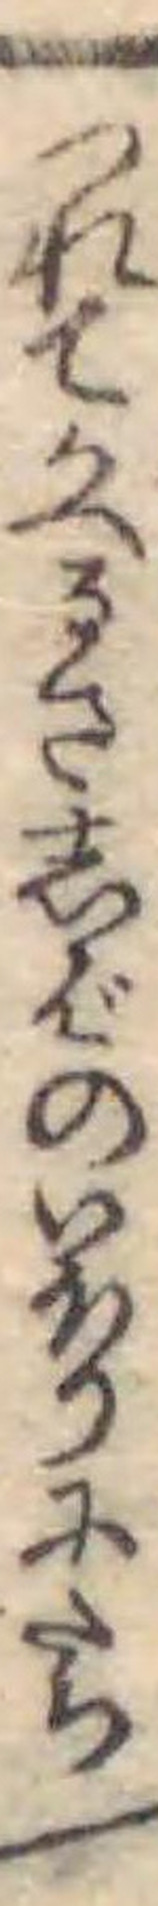つれてかへるさしばのいほりにたち
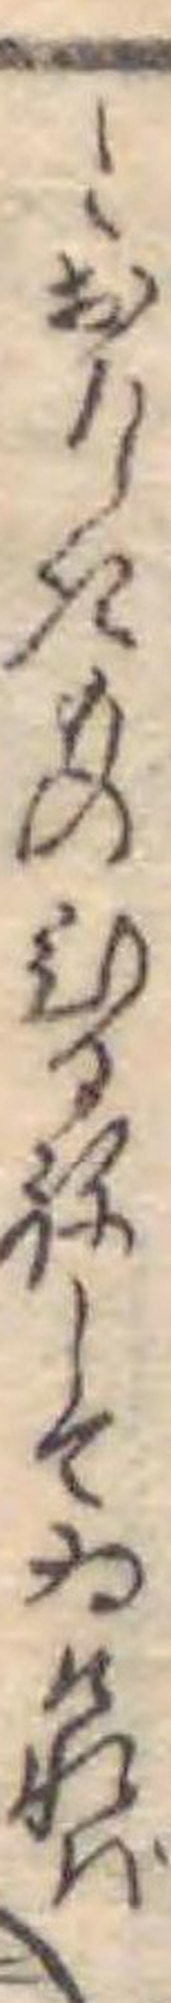とおりしきものひるねしてゐければ
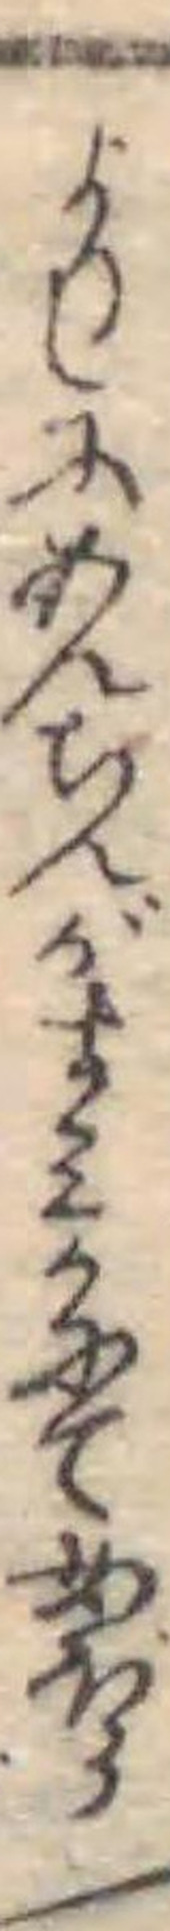よりしにあんちんがすみかにて女ぼう
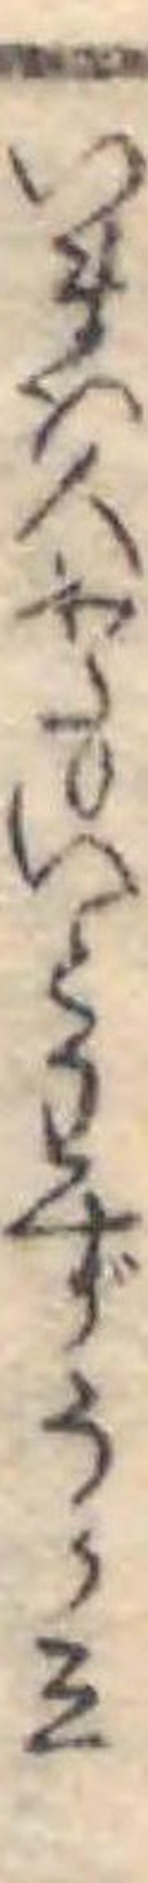いまは人にもいとわずうらみ
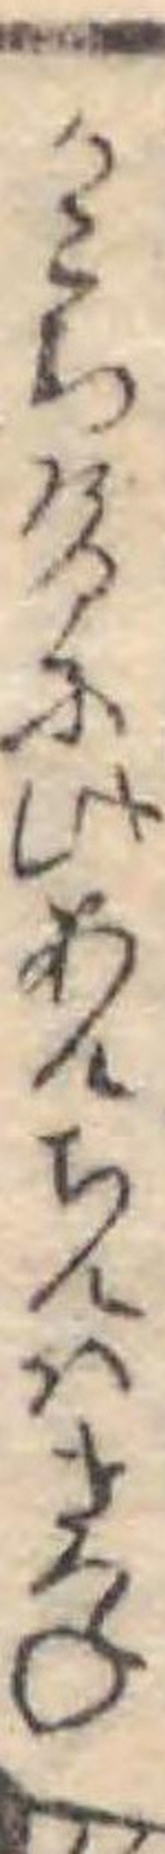かこちけるに此あんちんはきつね
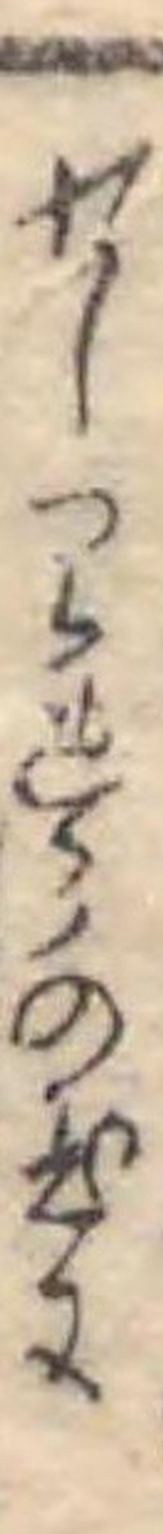せしりれうの玉に
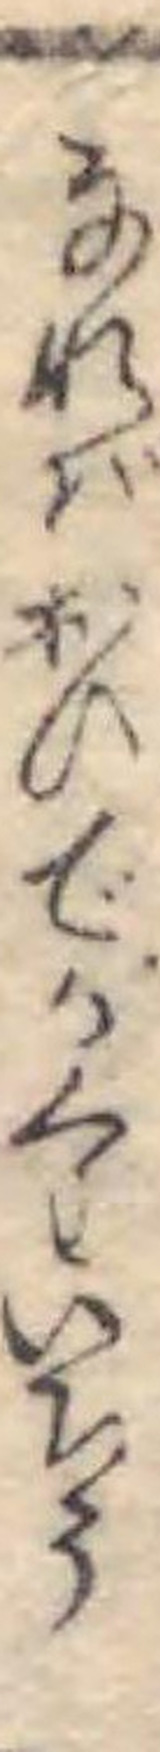なればおひでがくわいちう
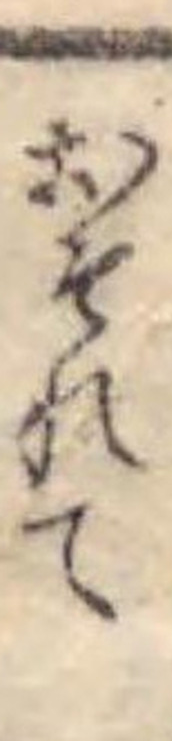おそれて
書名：鐘入七人化粧 : 3巻
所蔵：国立国会図書館 National Diet Library, JAPAN
